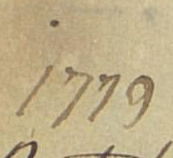1779
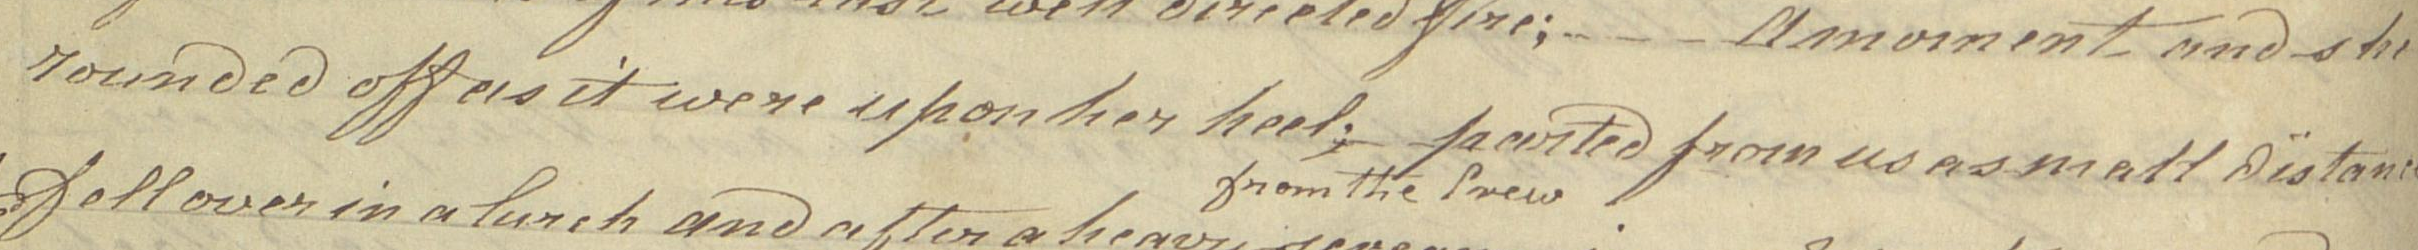rounded off as it were upon her heel; parted from us as mall distance
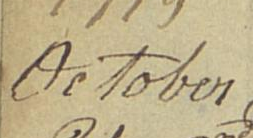October
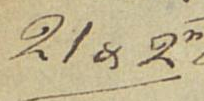21 & 2^nd
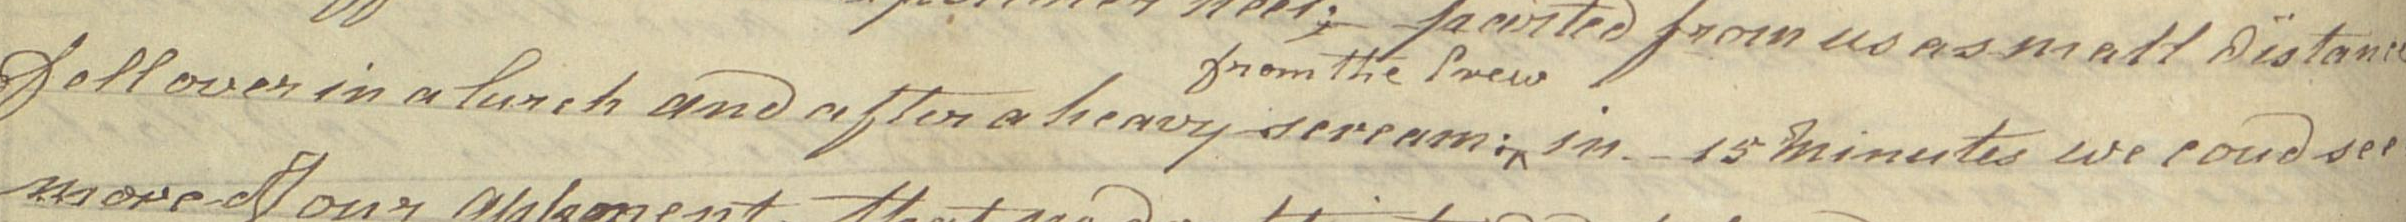Follover in a lurch and after a heavy scream; ^ in 15 minutes we coud see
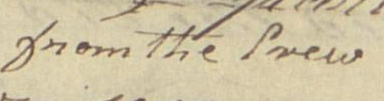from the Crew
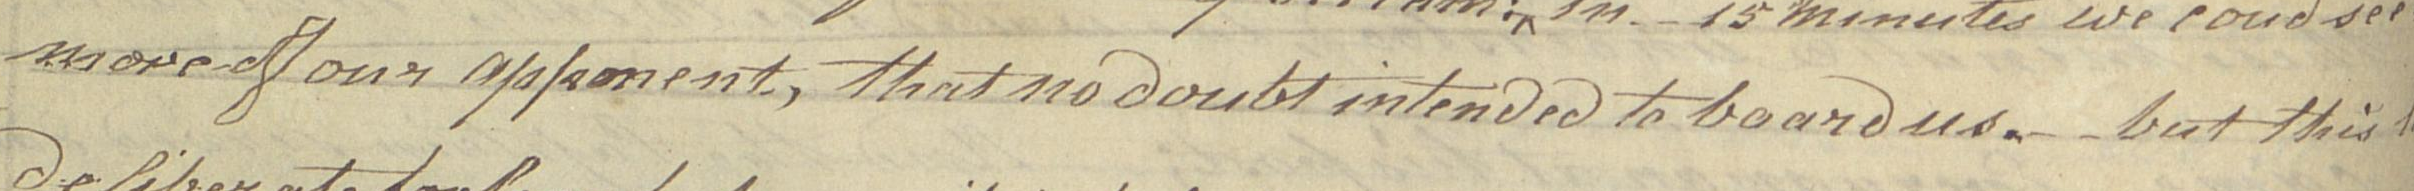more of our Opponent, that no doubt intended to board us, but this
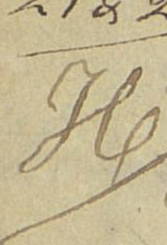H
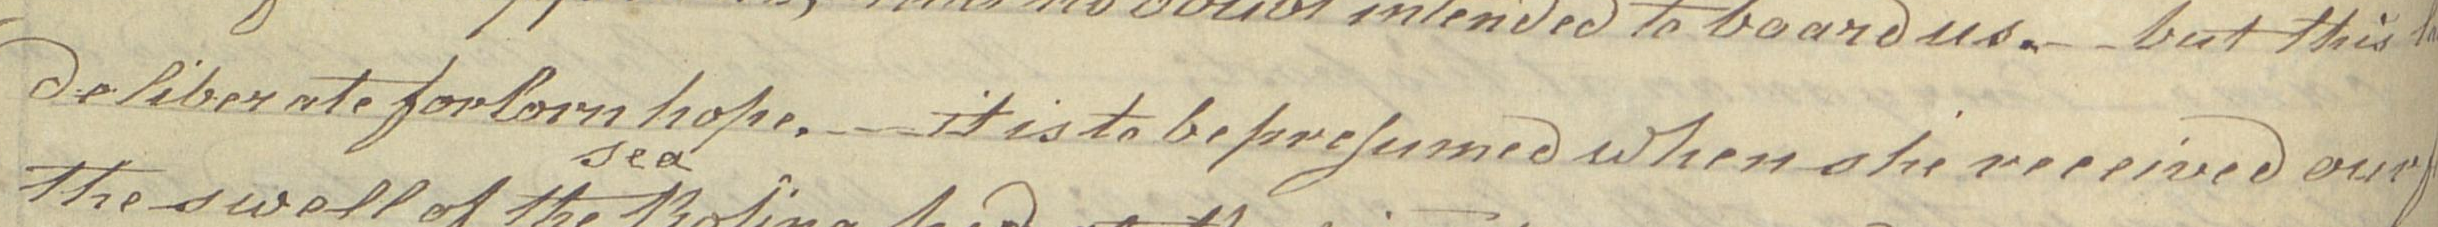deliberate forlorn hope. it is to be presumed when she received our
